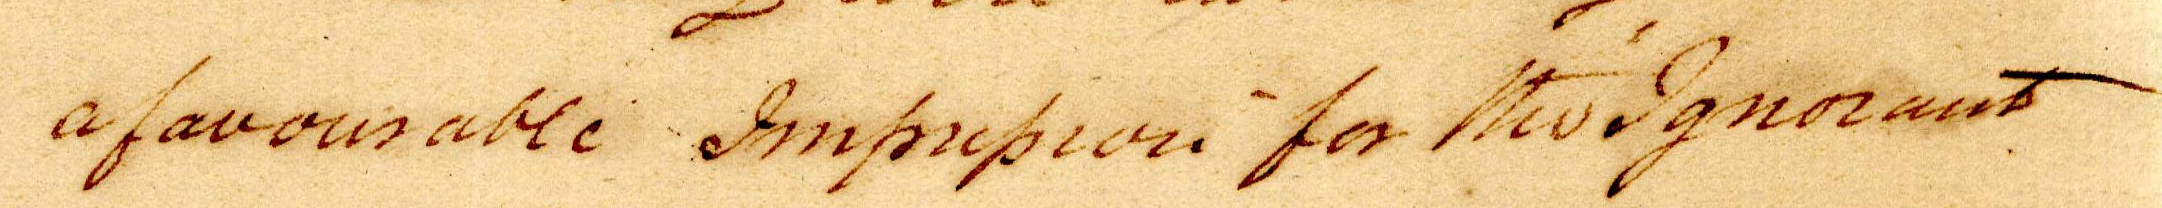a favourable Impression for the Ignorant
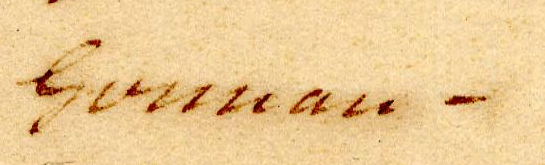German.
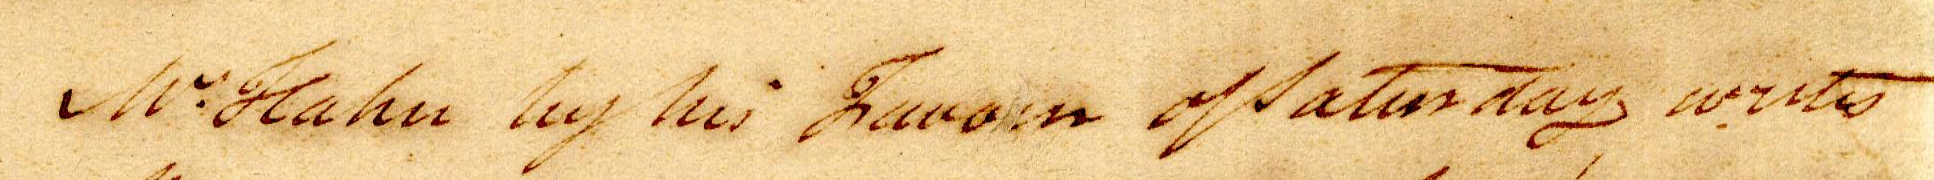M^r. Flakes by his Favor of Saturday writes
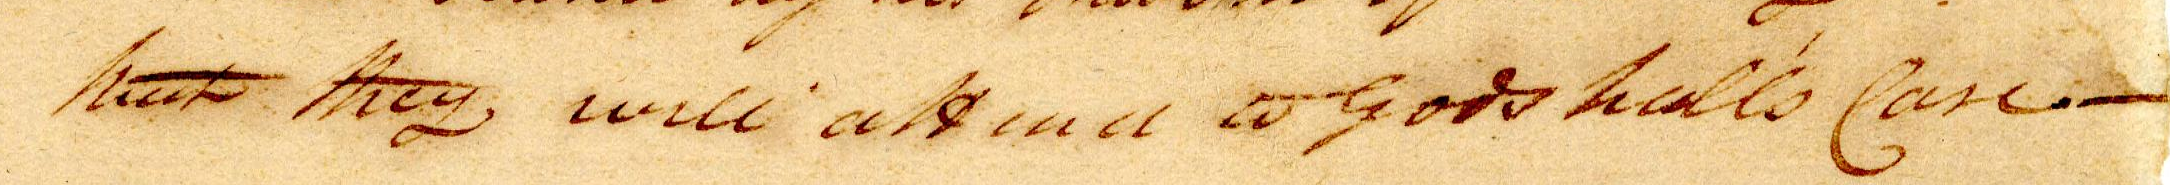that they will all end to Godshalls Care.
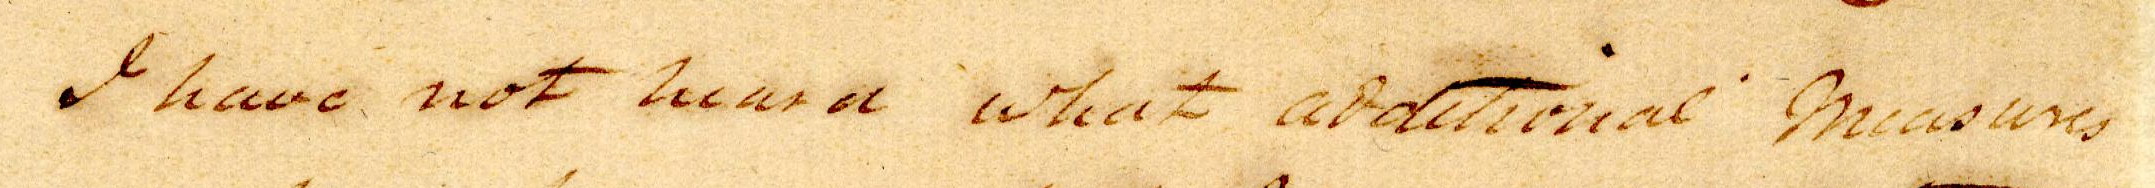I have not heard what additional measures
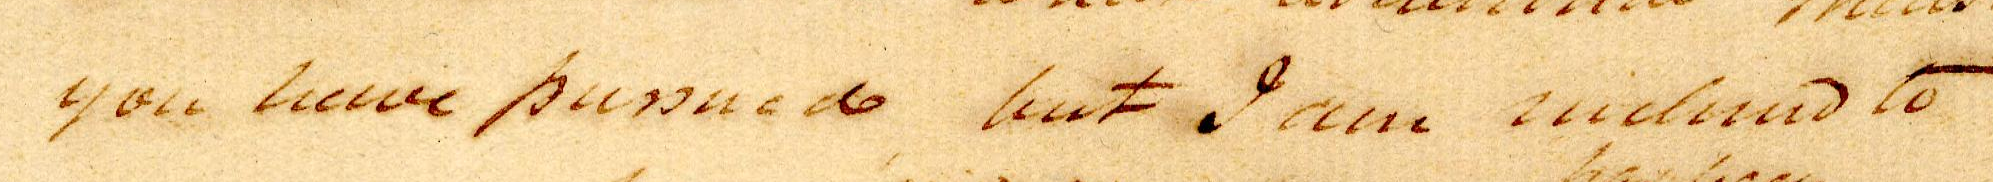you have pursued but I am reduced to
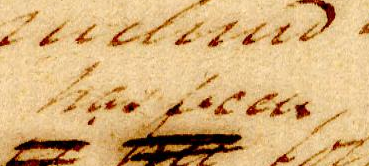has been
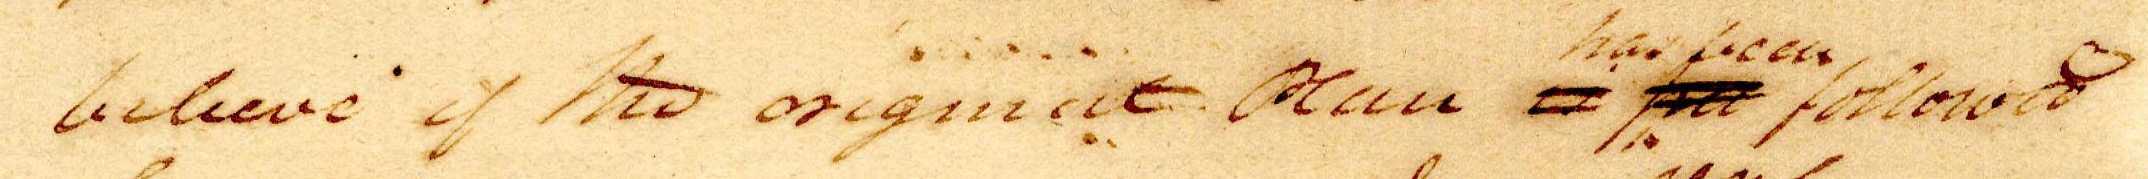believe if the original Plan is from ^ followed
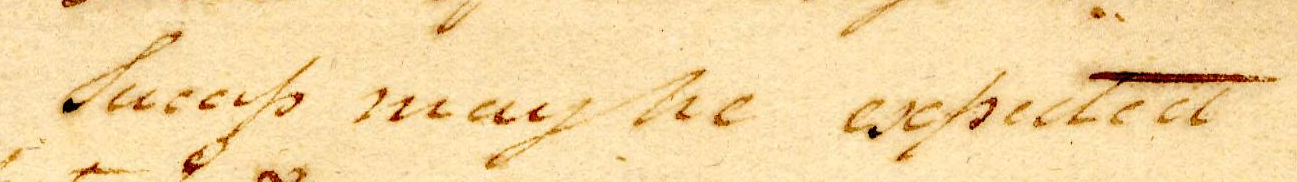Success may be expected
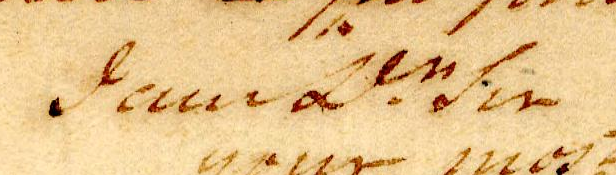I am D^r Sir
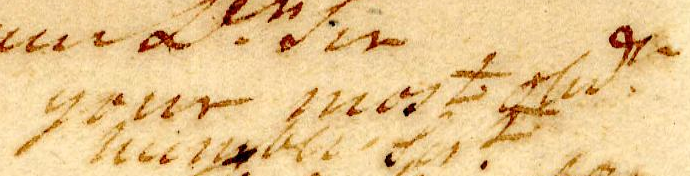your most obed^t.
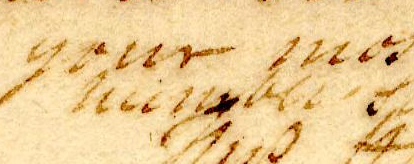humble serv^t
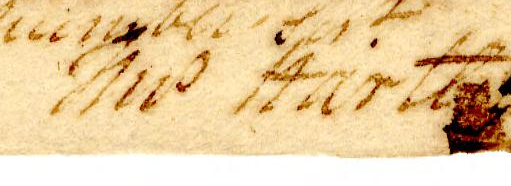Tho^s. Hartley
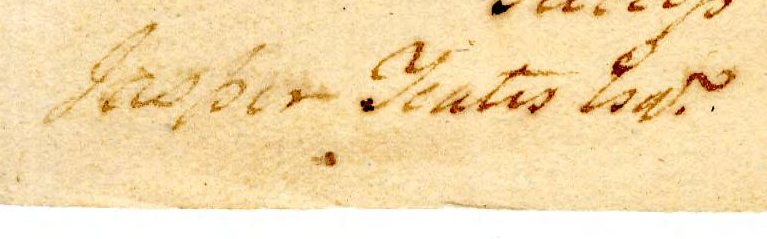Jasper Yeates Esq^r.
